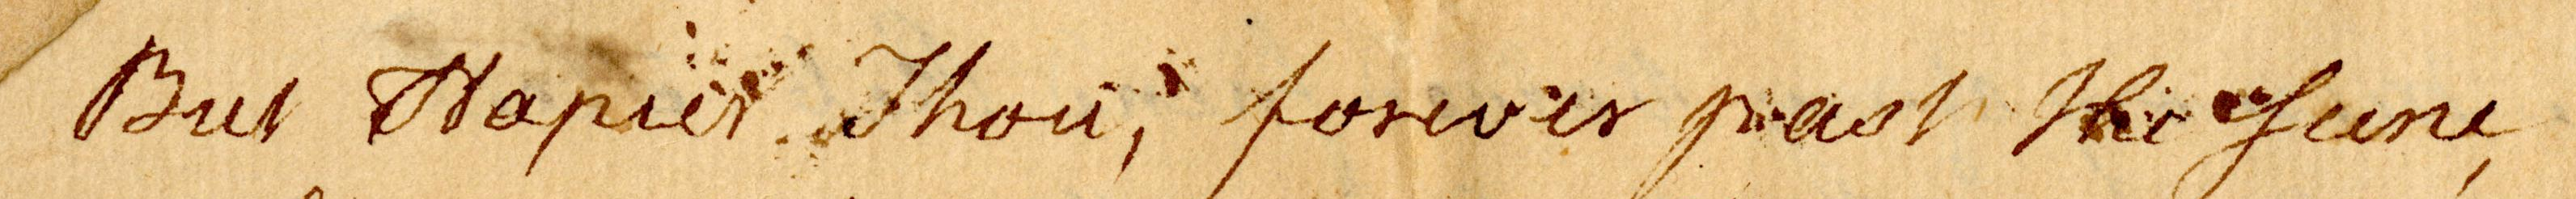But Hapier Thou; forever past the scene,
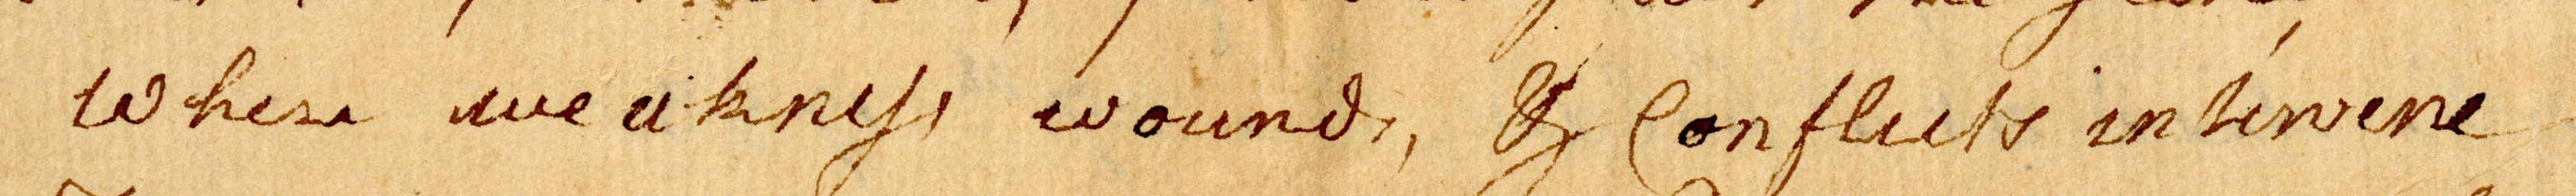Where weakness wounds, & Conflicts intervene
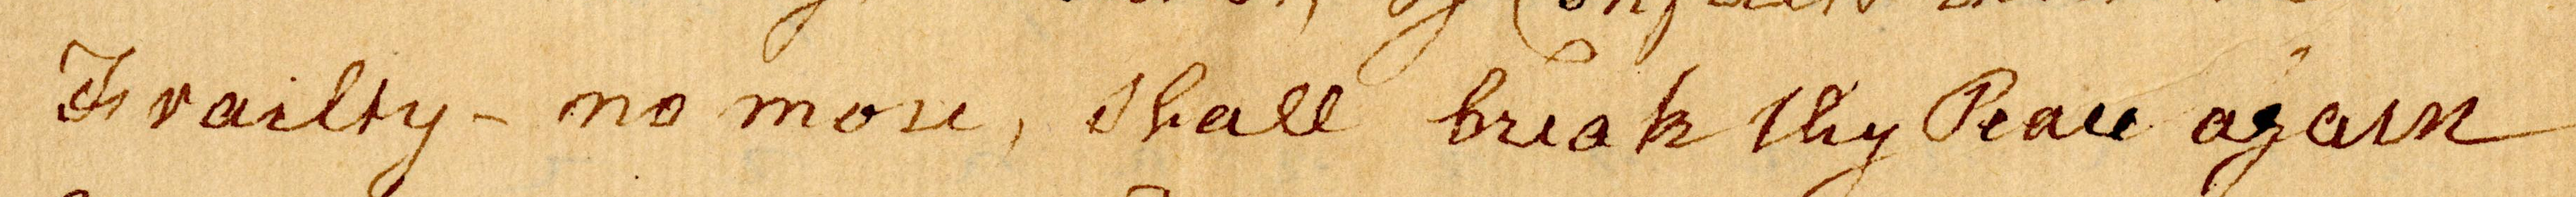Frailty- no more, shall break thy Peace again
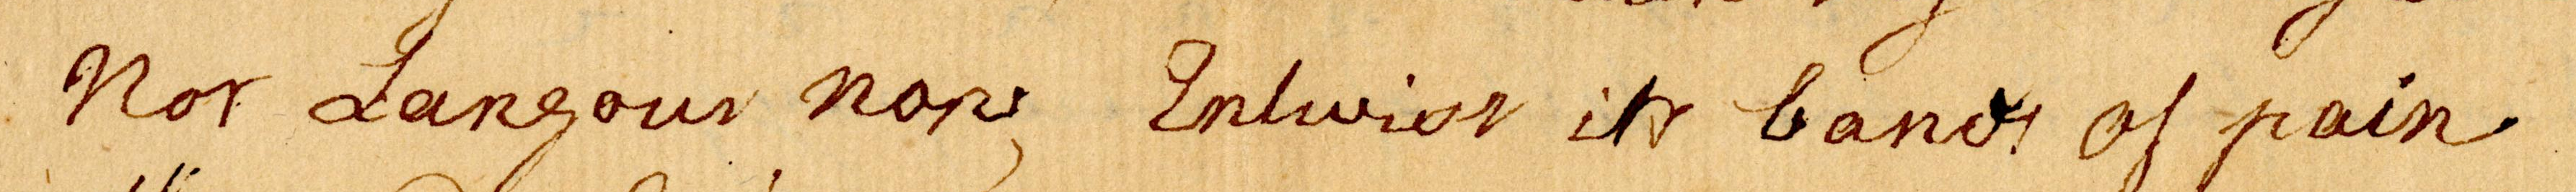Not [Langour] nor Entwist its bands of pain
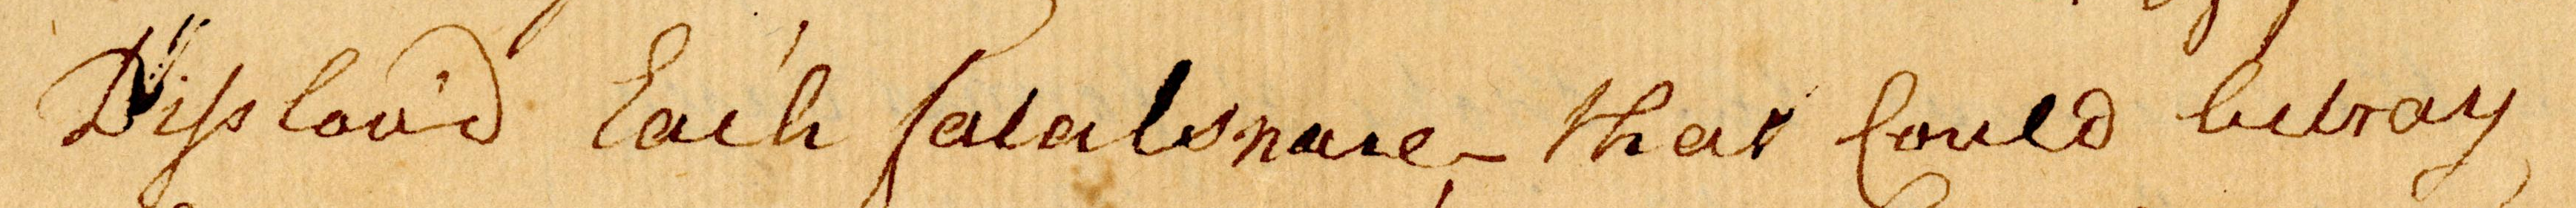Disslov'd Each falal snare,- that Could betray,
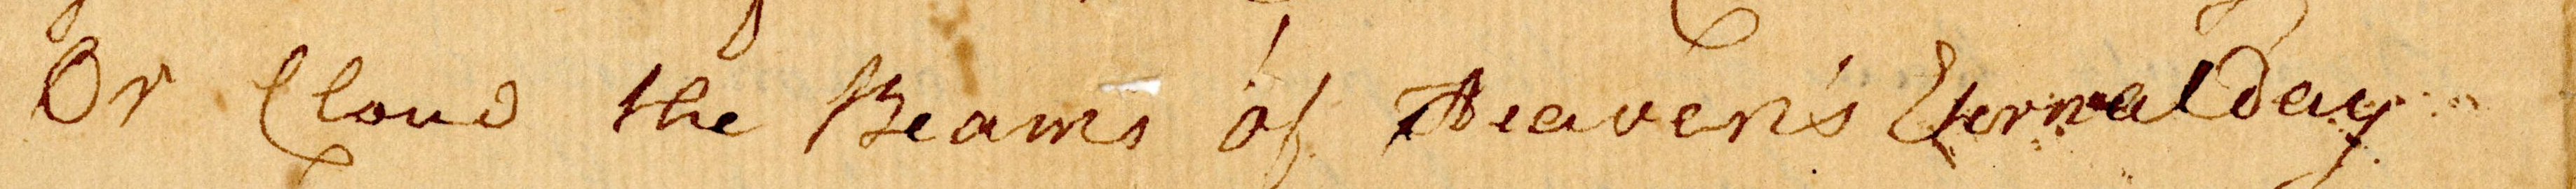Or Cloud the Beams of Heaven's Eternal day
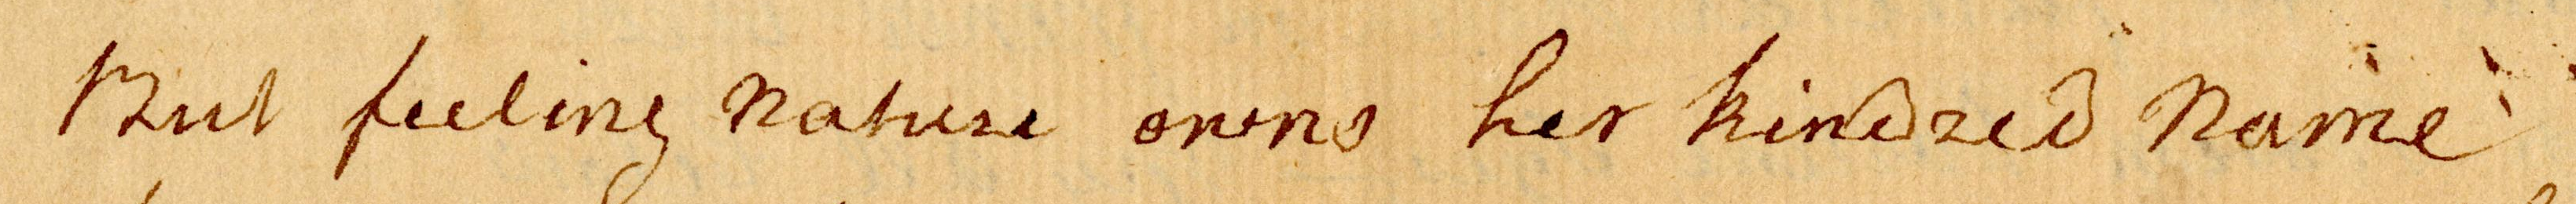But feeling Nature owns her kindred name
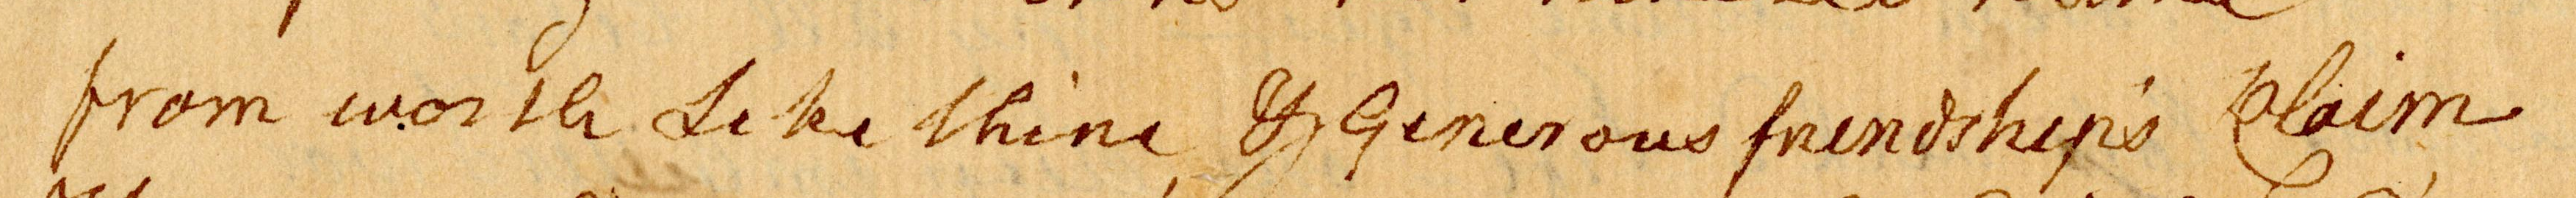from worth Like thine, & Generous frendship's Claim
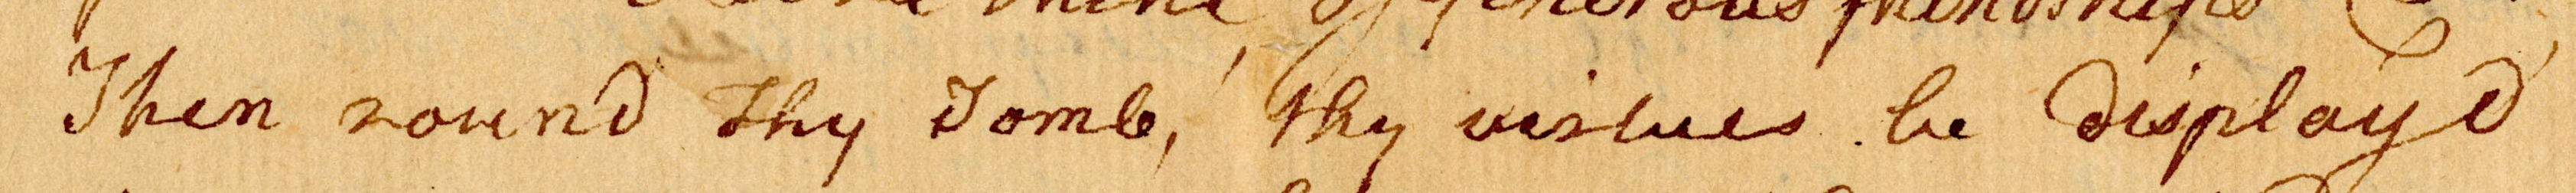Then round thy Tomb, thy virtues be displayd'
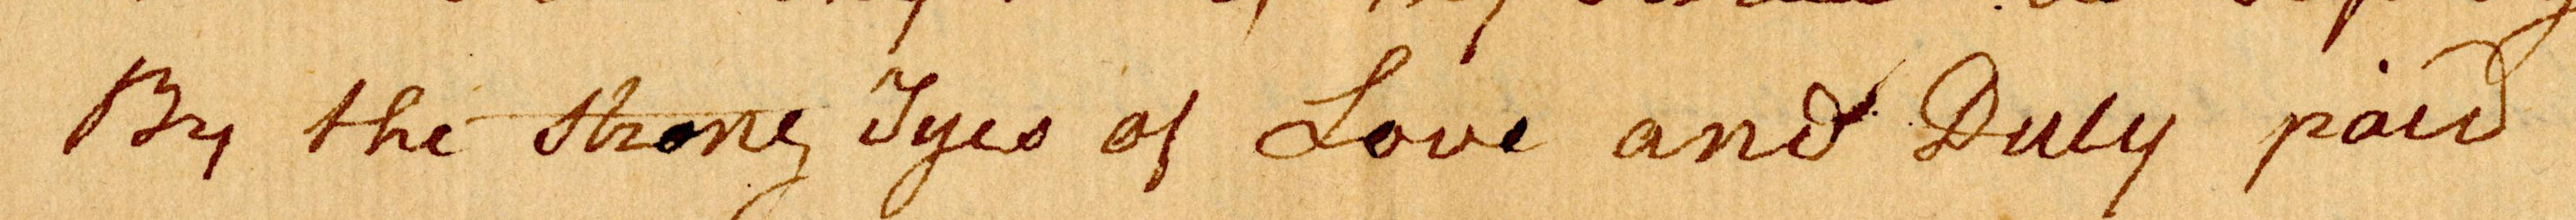By the Strong Tyes of Love and Duty paid
